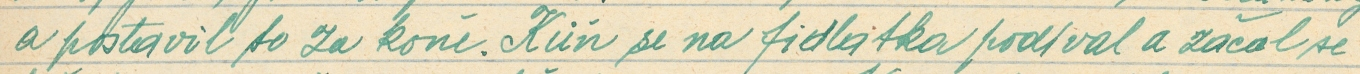a postavil to za koně. Kůň se na fidlatka podíval a začal se
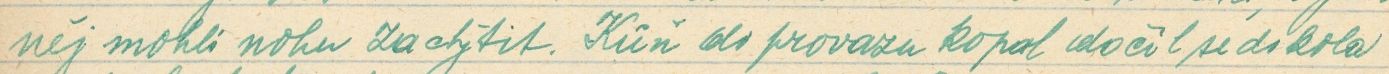něj mohli nohu zachytit. Kůň do provazu kopal dočil se dokola
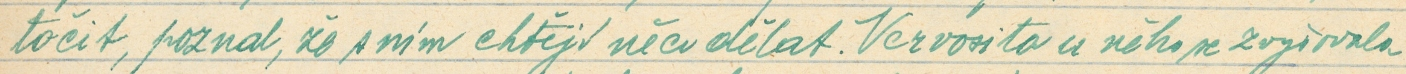točit, poznal, že s ním chtějí něco dělat. Nervosita u něho se zvyšovala
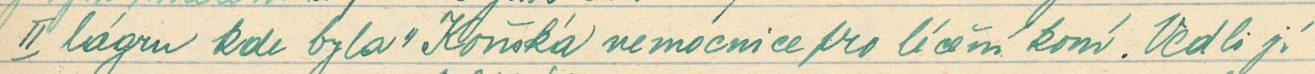II lágru kde byla „Koňská nemocnice pro léčení koní. Vedli jí
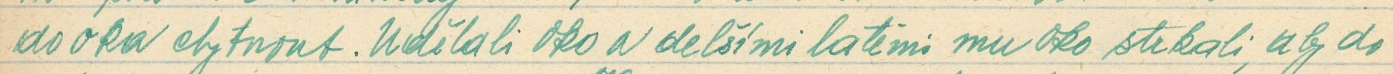do oka chytnout. Udělali oko a delšími latěmi mu oko strkali, aby do
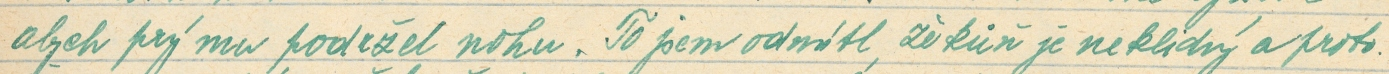abych prý mu podržel nohu. To jsem odmítl, že kůň je neklidný a proto
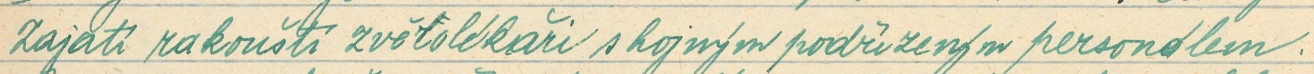zajatí rakouští zvěrolékaři s hojným podřízeným personálem.
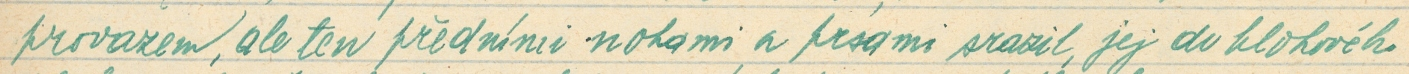provazem, ale ten předními nohami a prsami srazil, jej do hlohového
